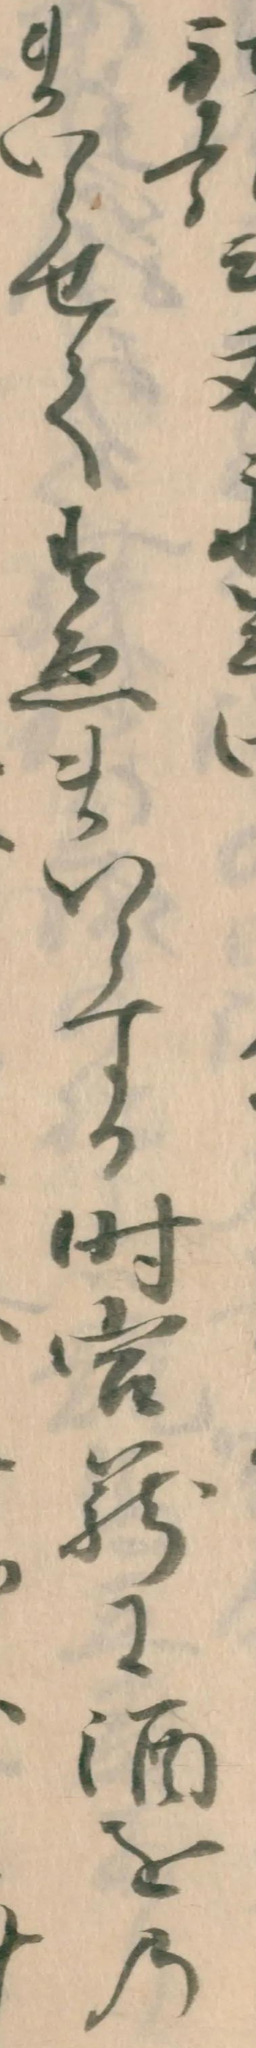まいらせてすゑまいらする時宮籠に酒をの
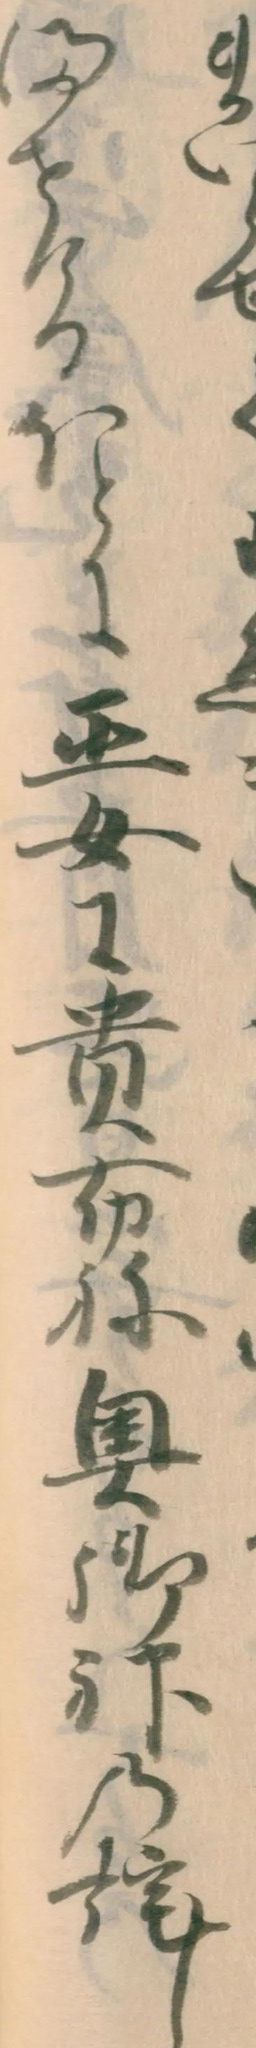ませけるほとに巫女に貴ふね奥御神の詫し
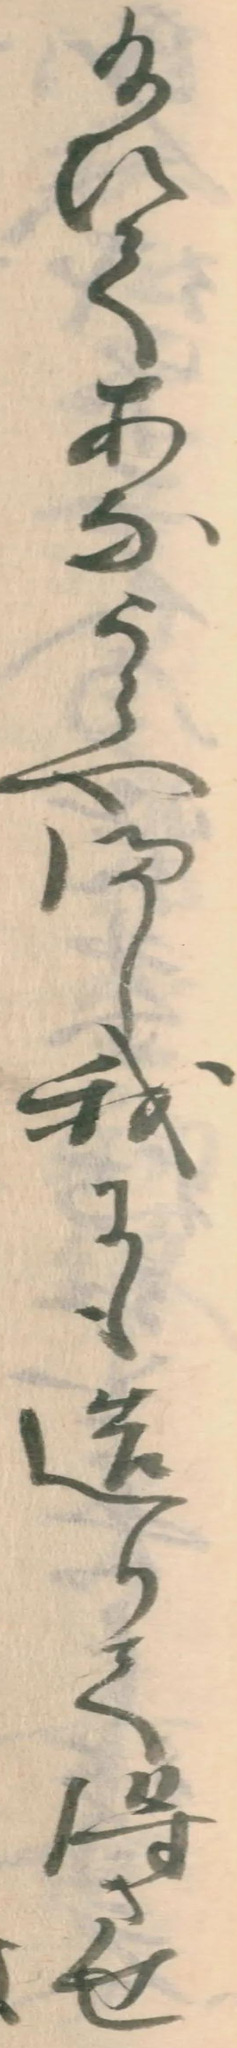給ひてあなうらやまし我にも造りて得させよ
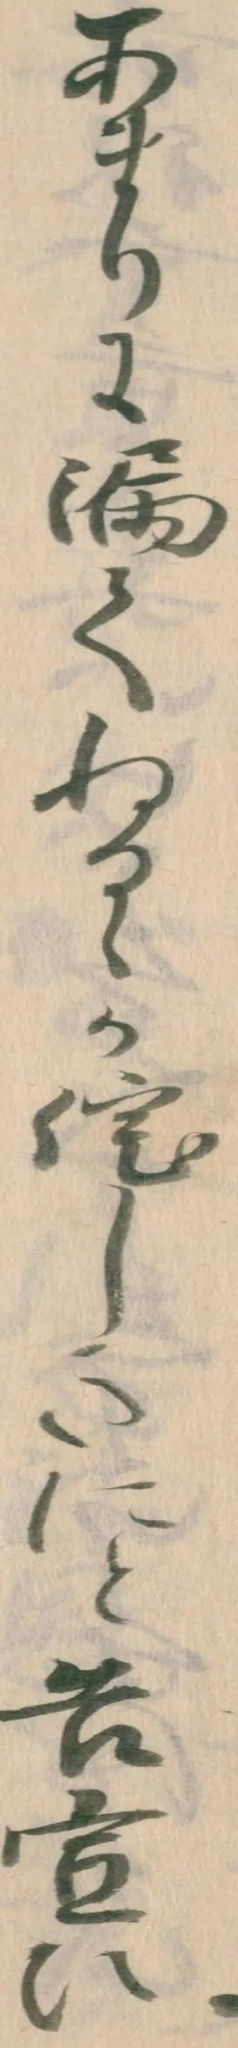あまりに漏てねるゝか侘しきにと告宣ひ
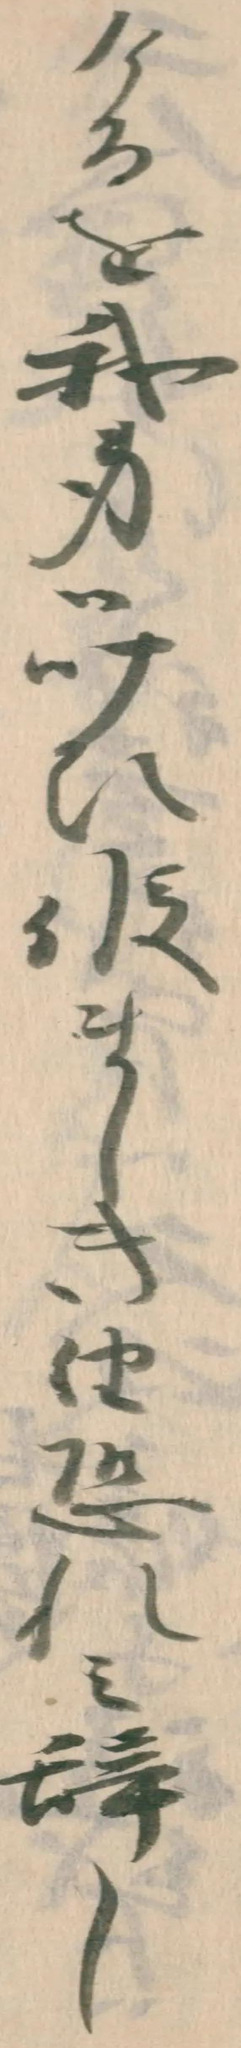けるを我身は叶ひ候ましき由恐れみ辞し
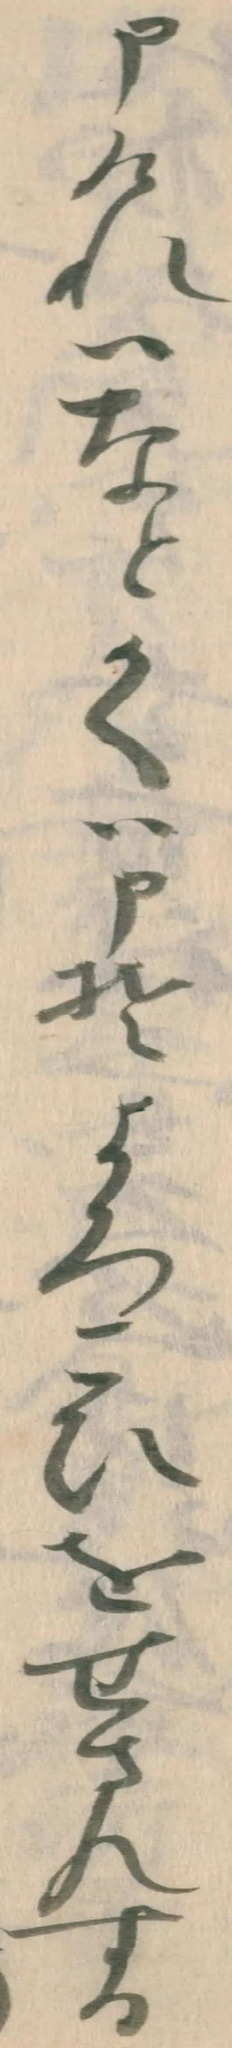申けれはなとかくは申そよろこひをせさんするそ
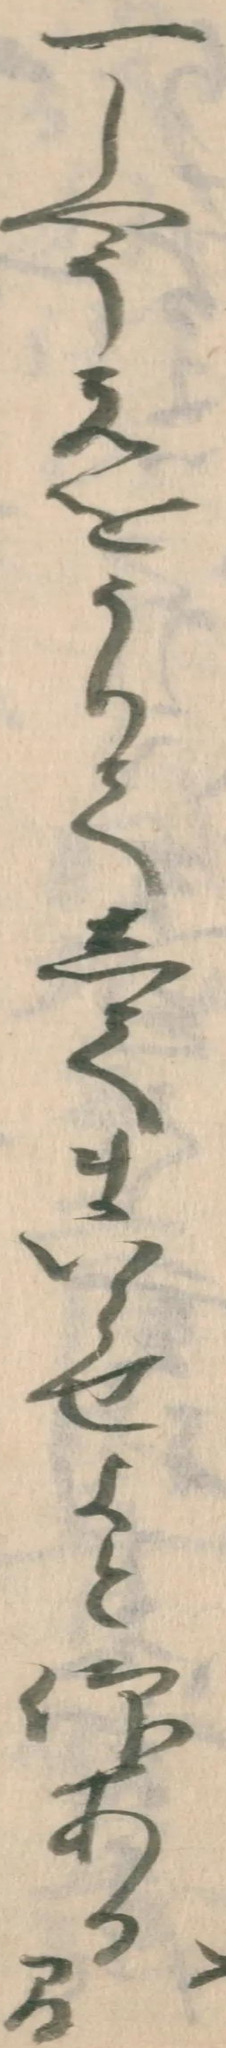一しやうえをうりてしてまいらせよと仰ある間
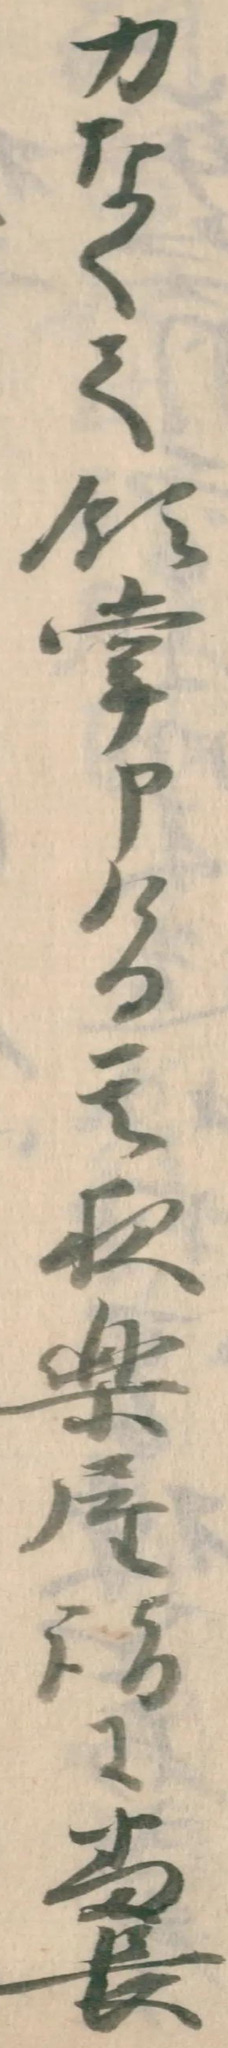力なくて領掌申ける其夜楽屋詣に番長
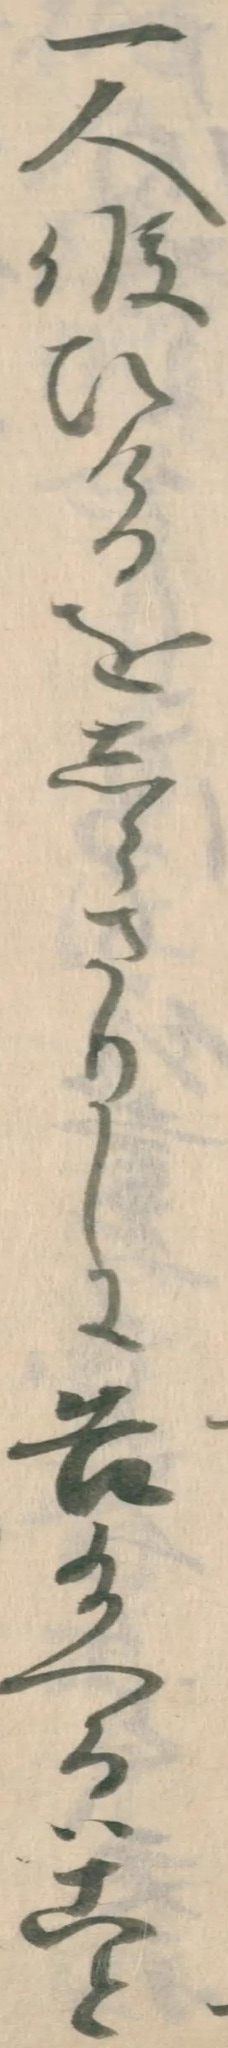一人候ひけるをしらさりしに告給へるはこと
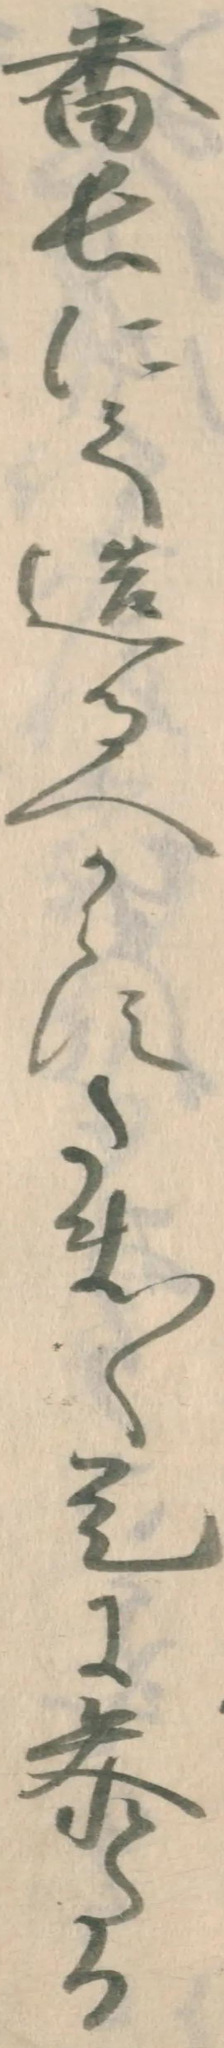番長にて造るへからすたま〳〵是に参たる
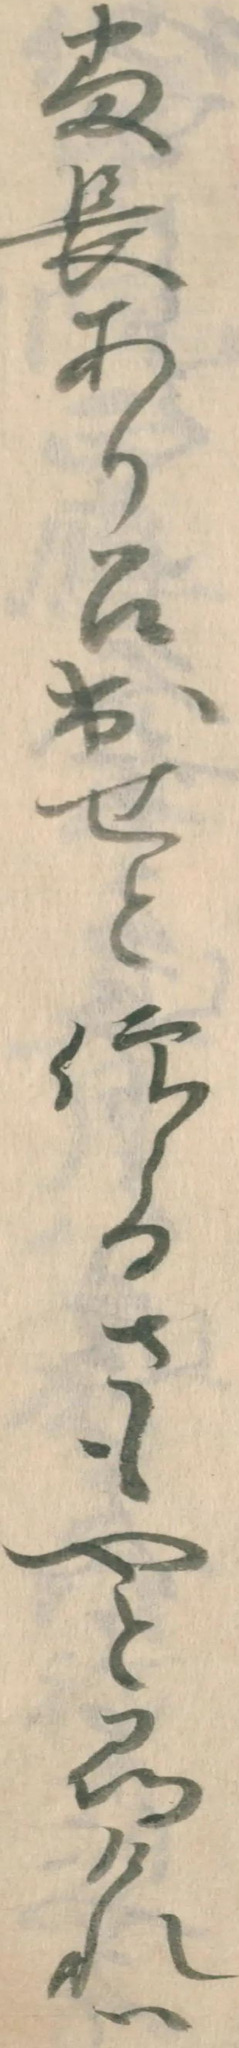番長あり召出せと仰らるさもやと尋けれは
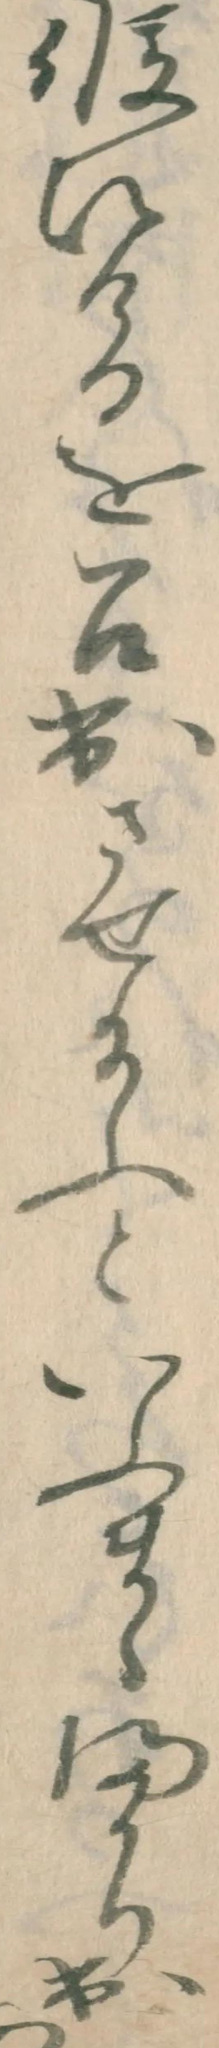候ひけるを召出させ給ふといふまゝまかり出ぬ

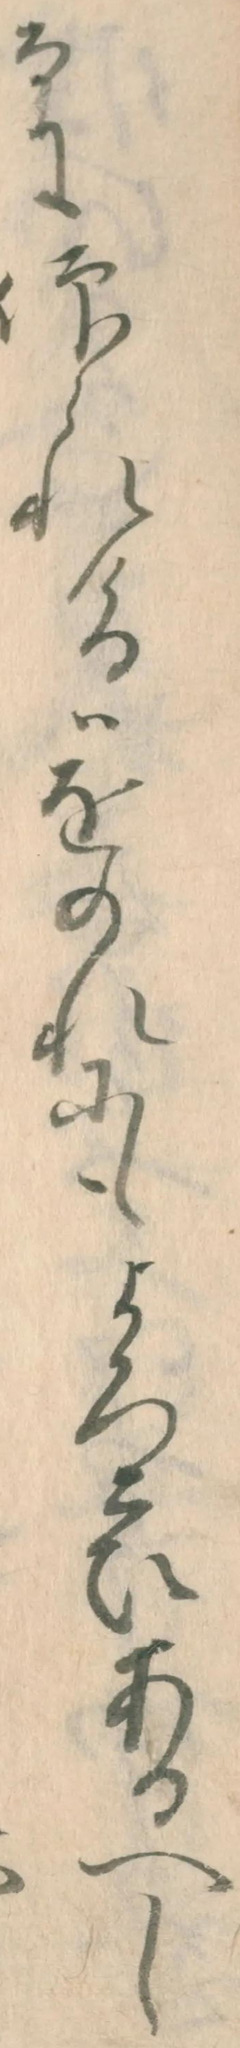るに仰られけるはをのれにもよろこひあるへし
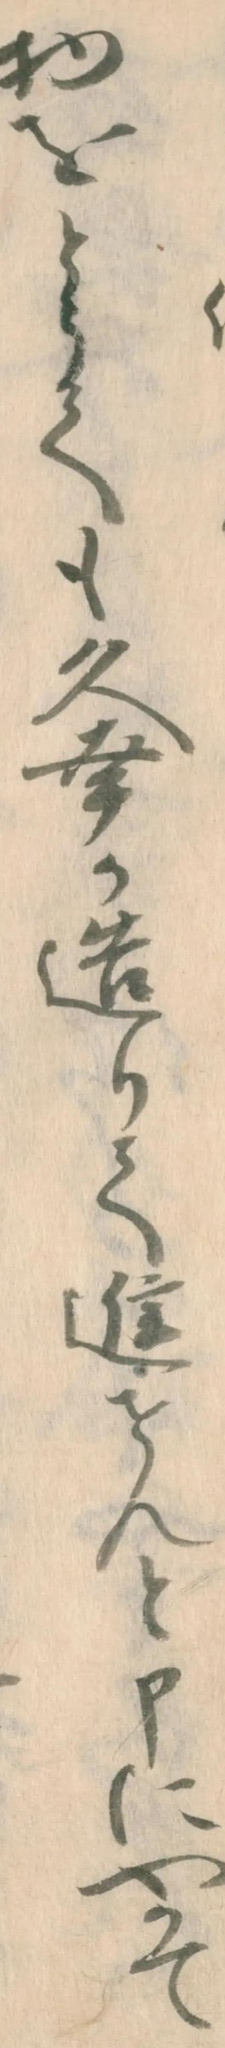物をとりても久幸か造りて進せんと申にやかて
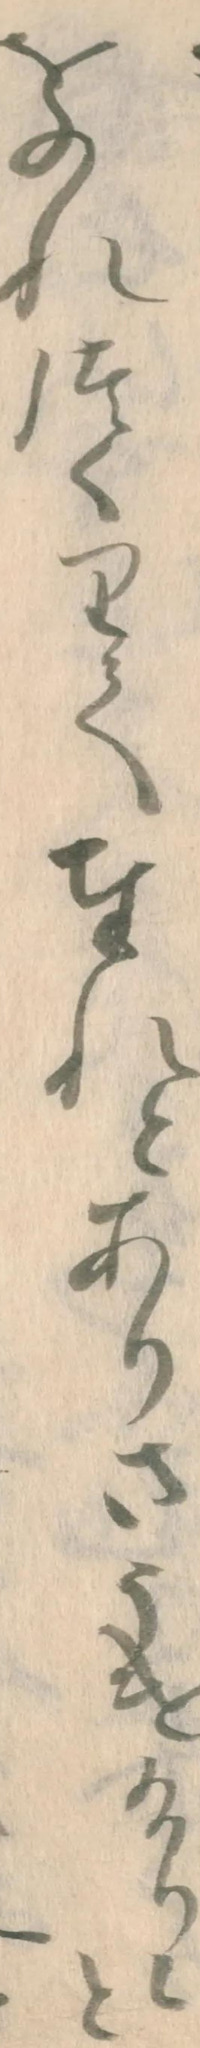をのれつくりて奉れとありさうけ給り候と
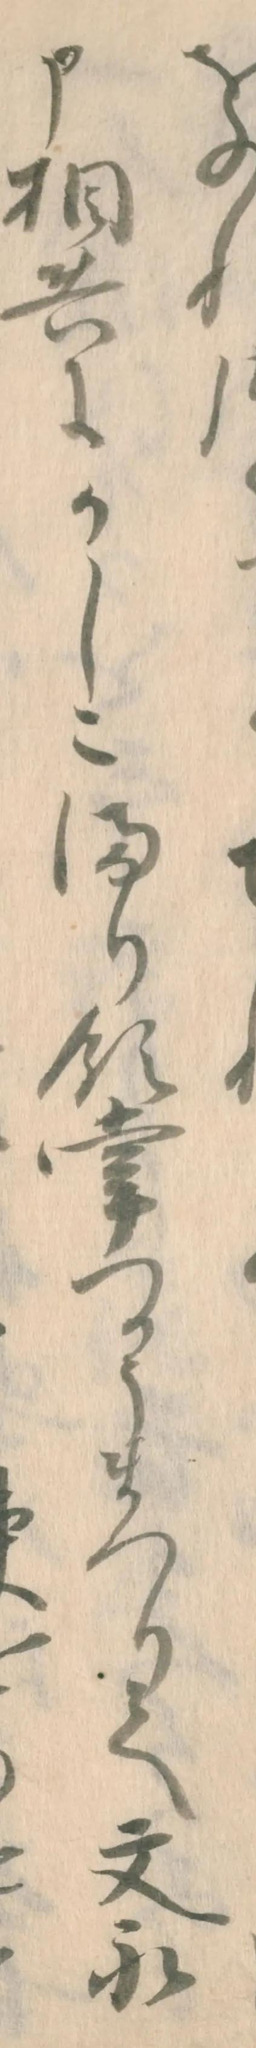申相共にかしこまり領掌つかうまつりて文永
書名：賀茂社記録. 第1冊
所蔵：国立国会図書館 National Diet Library, JAPAN
